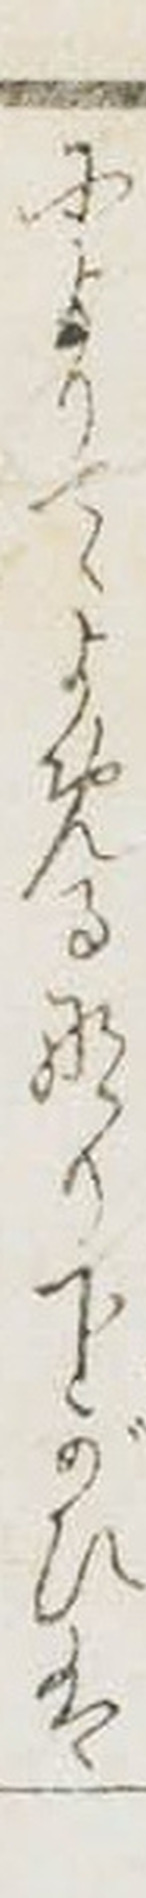によりてよめるなり下がひは
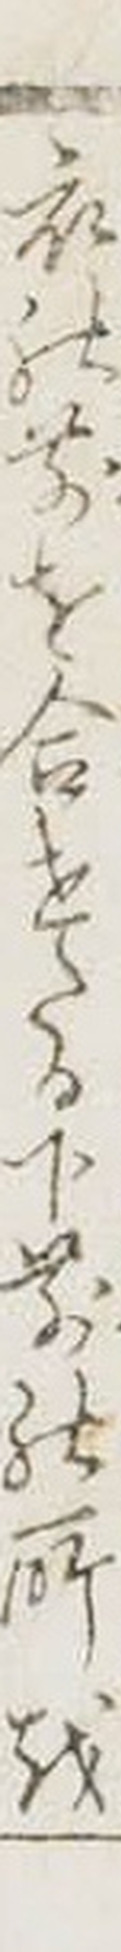衣の前を合せたる下前の所を
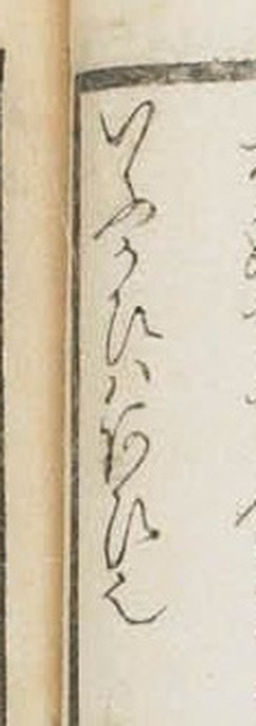いふかひはあひ也
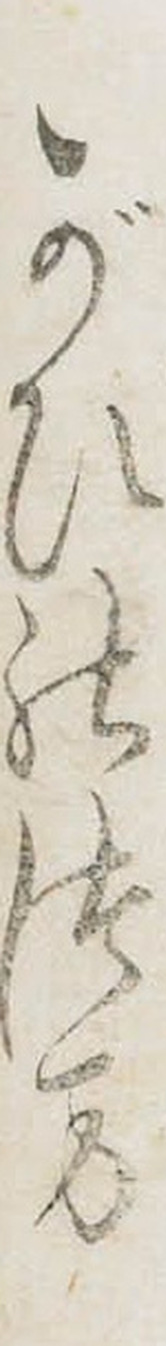がひのつま
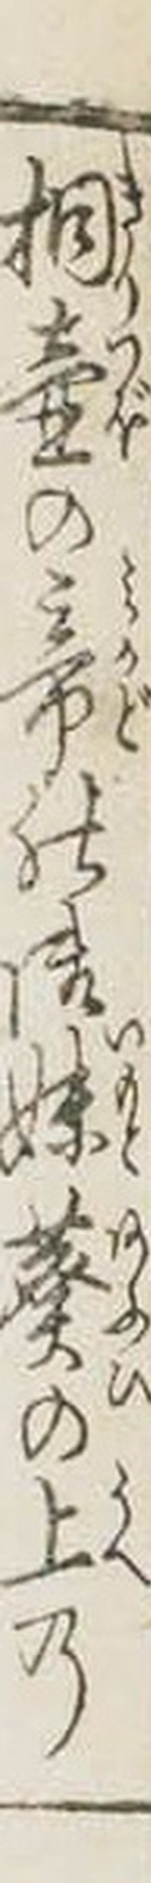桐壺の帝の御妹葵の上の
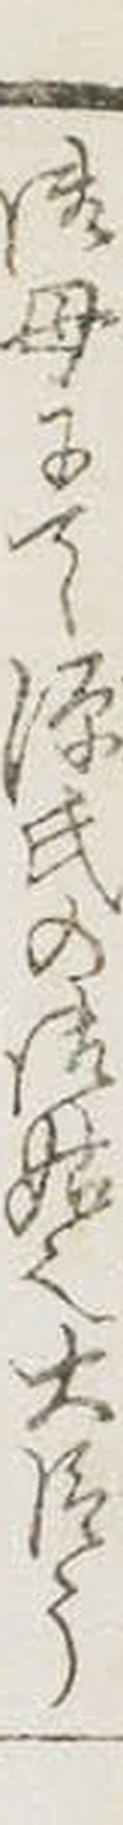御母にて源氏の御姑也大臣う
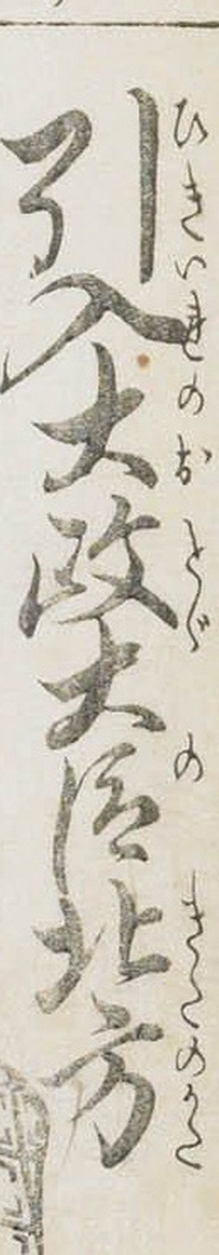引入大政大臣北方
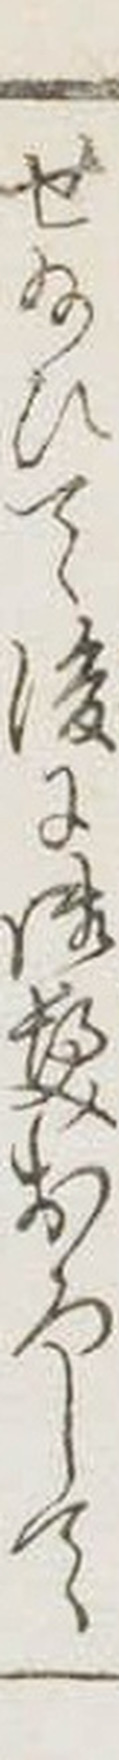せ給ひて後に御髪おろして
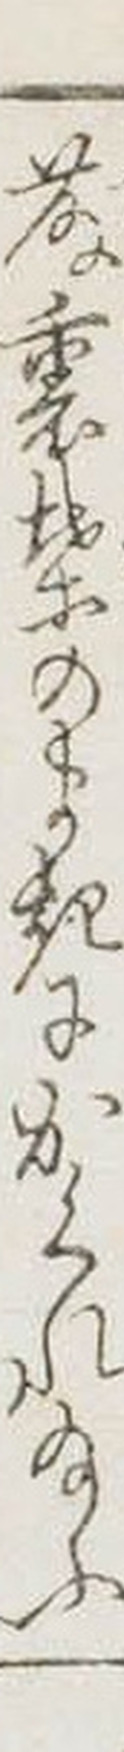藤裏葉のまきにかくれ給ふ
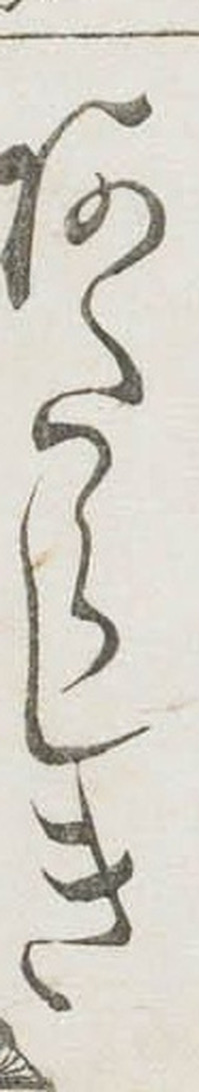あたらしき
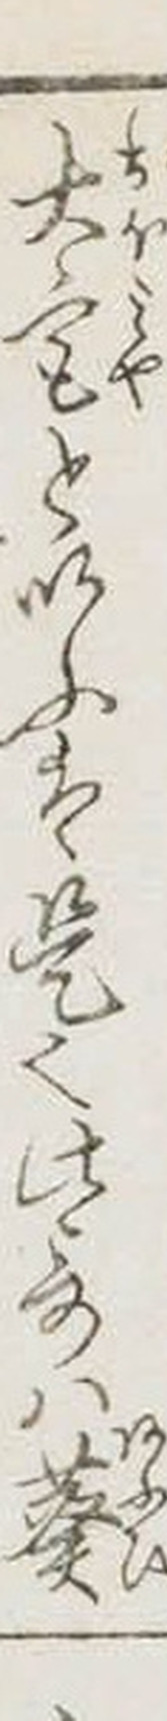大宮といふは是也此哥は葵
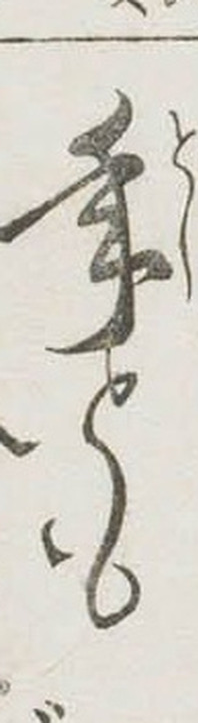年とも
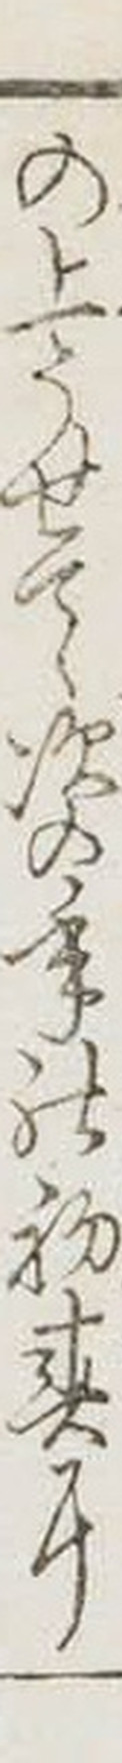の上うせて次の年の初春に
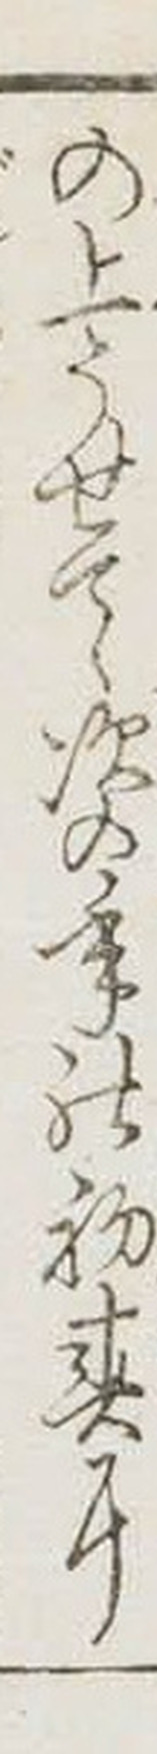の上うせて次の年の初春に
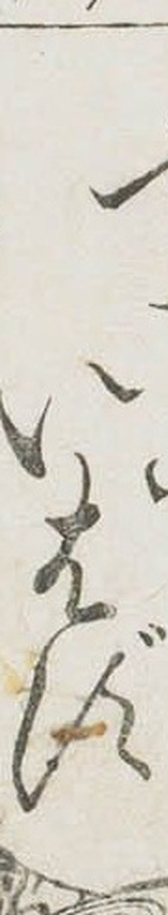いはず
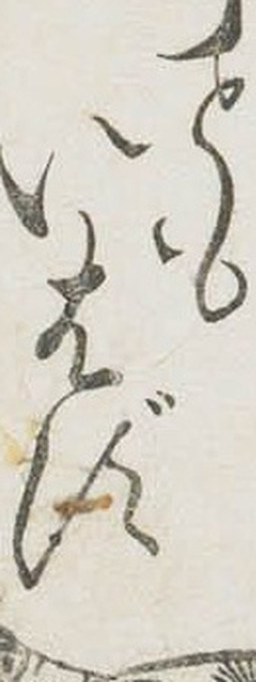いはず
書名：源氏百人一首
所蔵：東京学芸大学教育コンテンツアーカイブ
